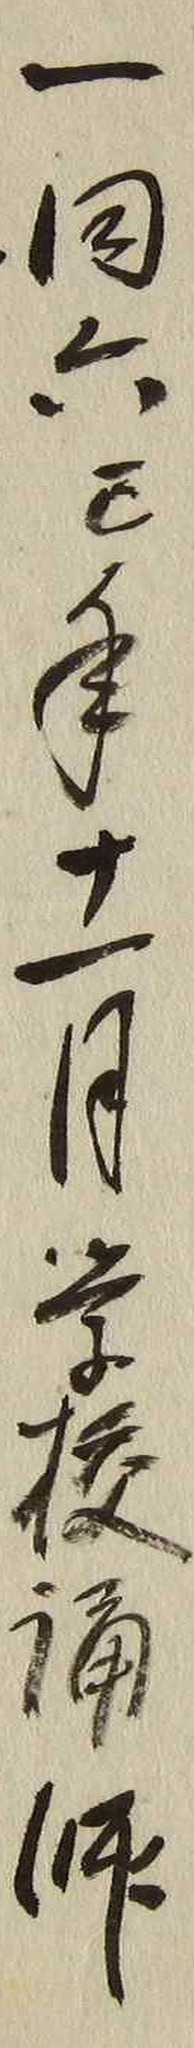一同六巳年十一月学校誦師
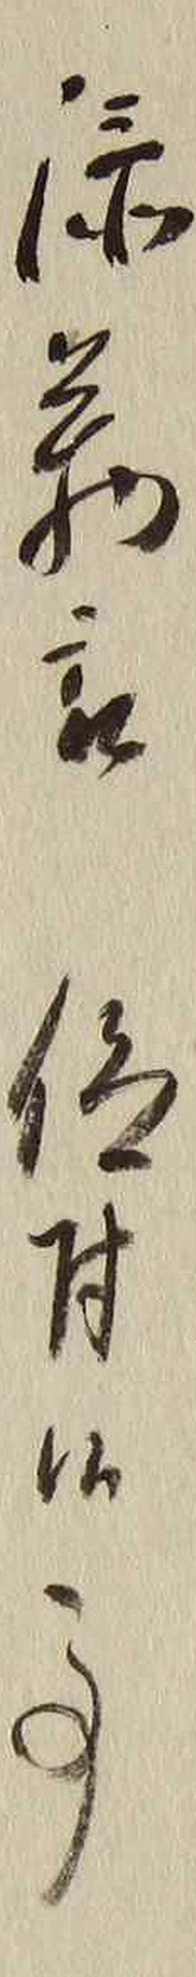添勤被仰付候事
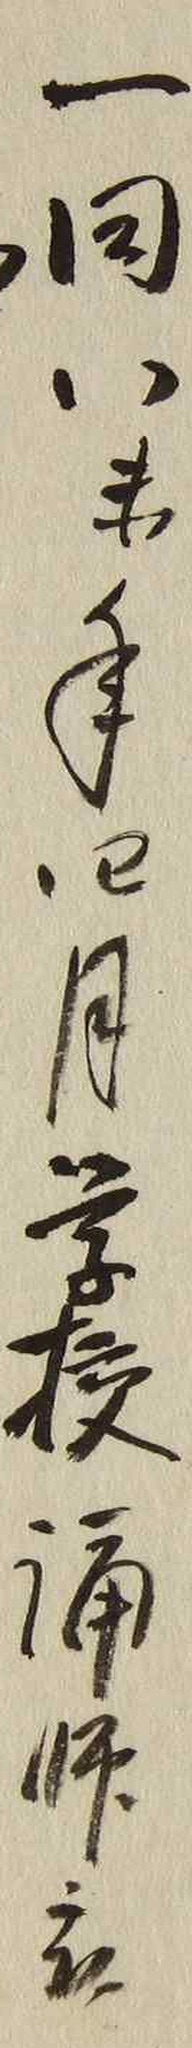一同八未年四月学校誦師被
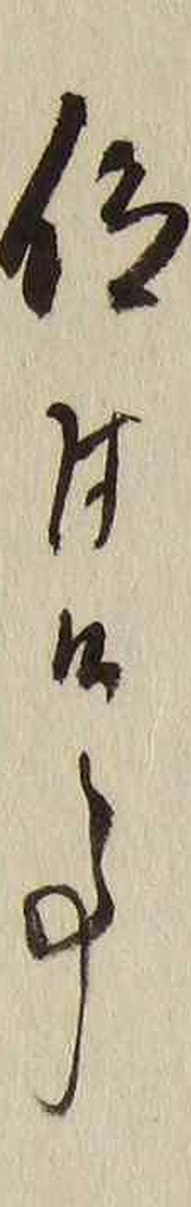仰付候事
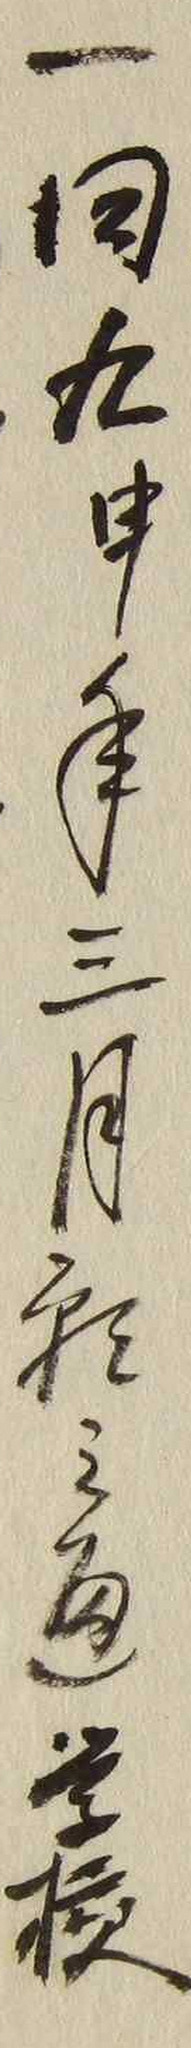一同九申年三月願之通学校
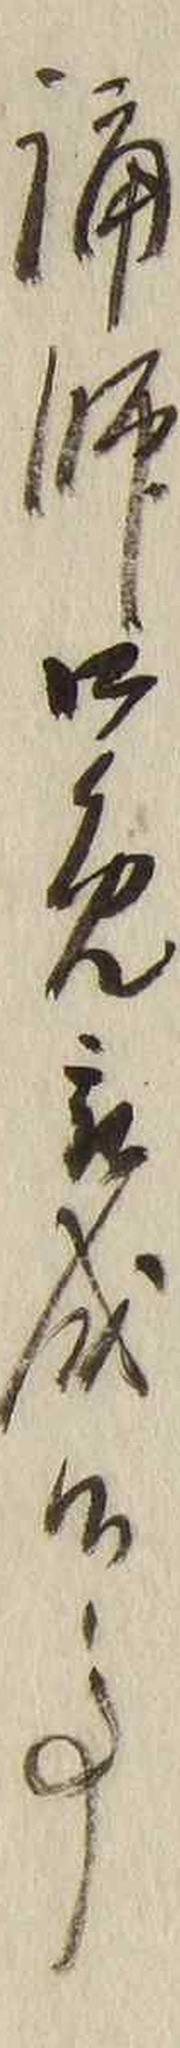誦師御免被成候事

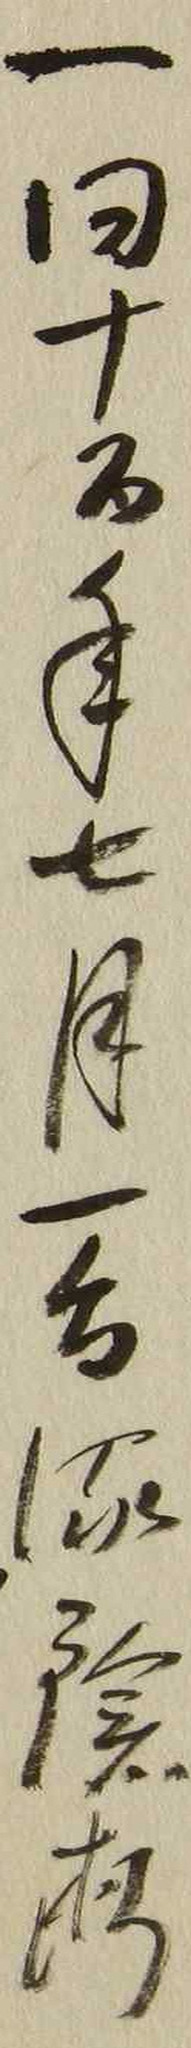一同十酉年七月一旨流鎗術
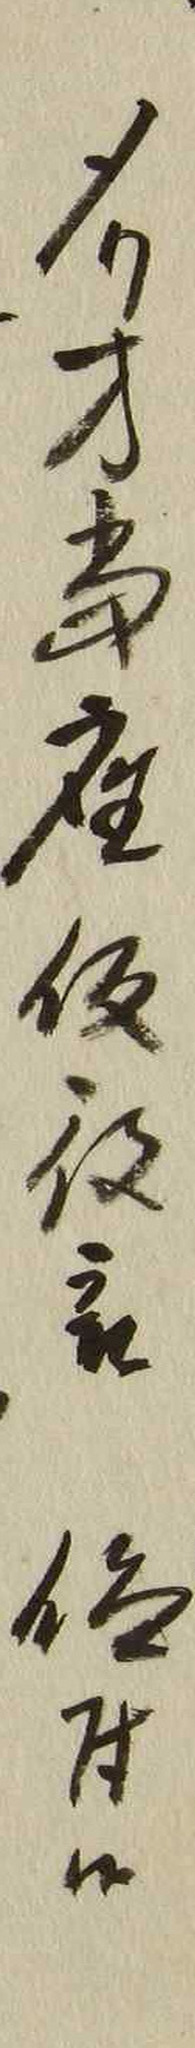〆り方当座仮役被仰付候
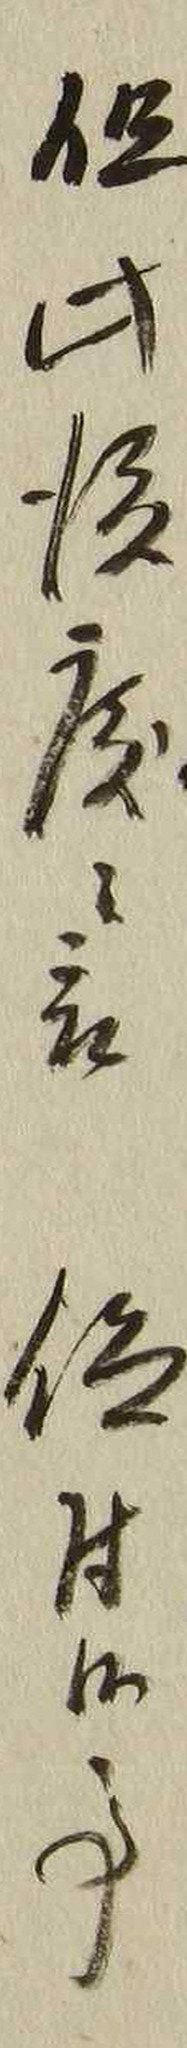但此後度々被仰付候事
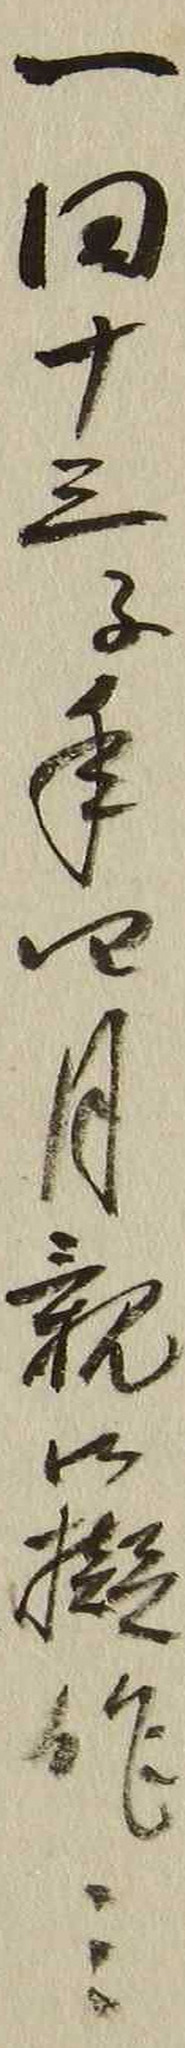一同十三子年四月親御擬作之
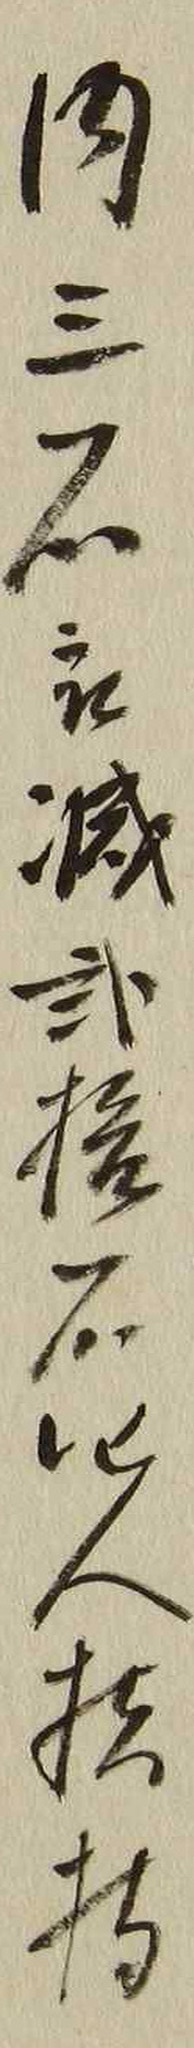内三石被減弐拾石四人扶持
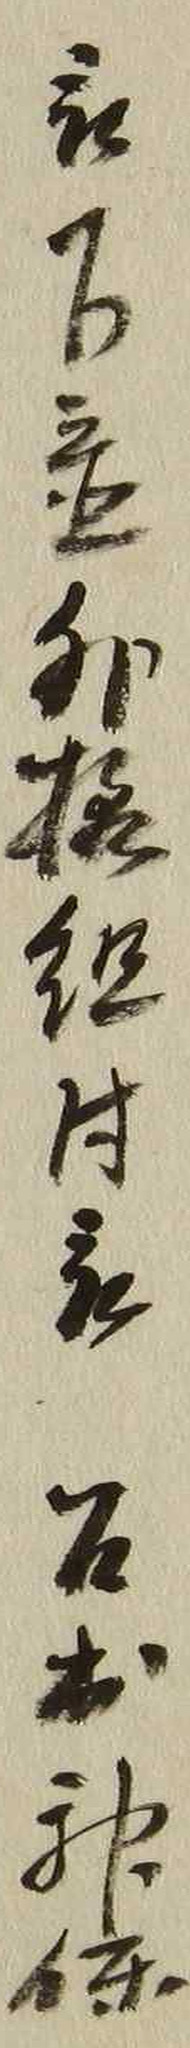被下置外様組付被召出神保
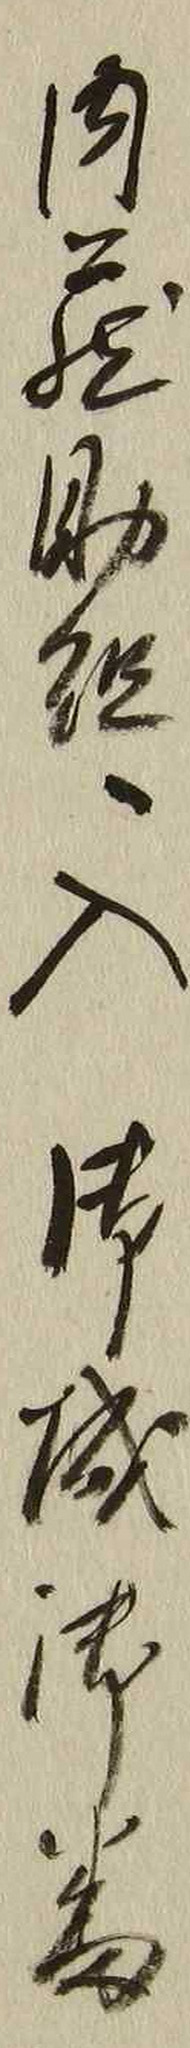内蔵助組へ入御城御番
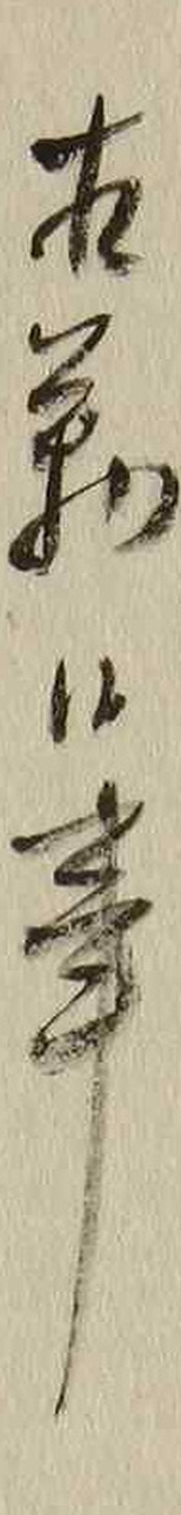相勤候事
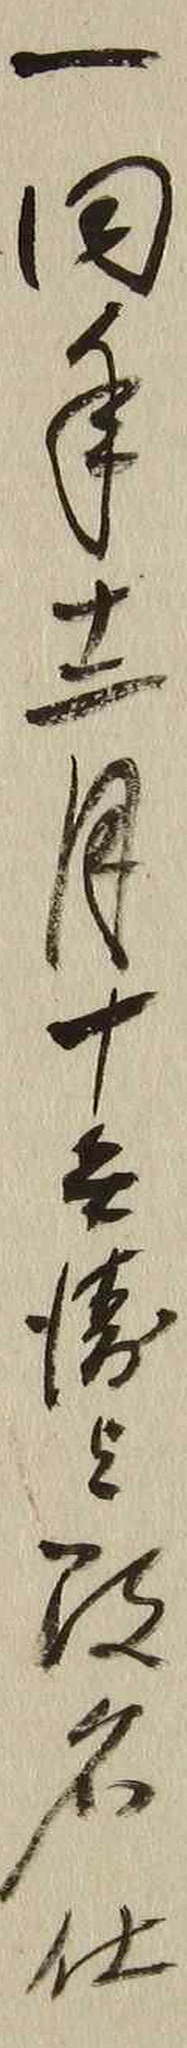一同年十二月十兵衛与改名仕
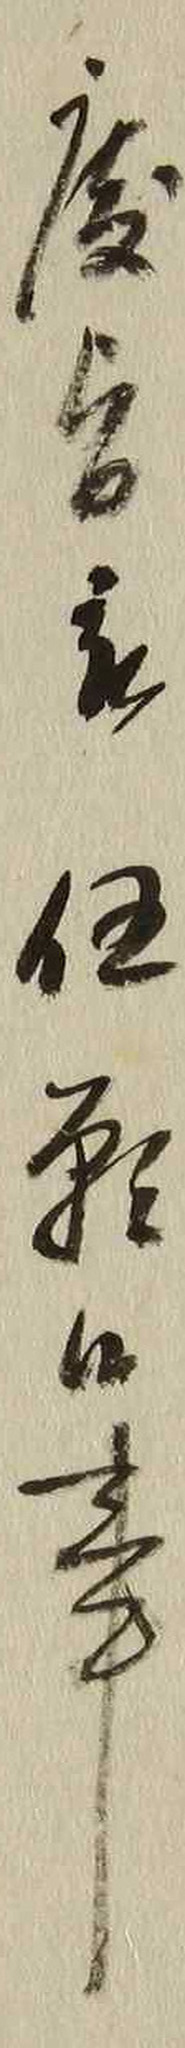度旨被任願候事
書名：諸士系譜　巻之359　す之部9
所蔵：会津若松市立会津図書館
